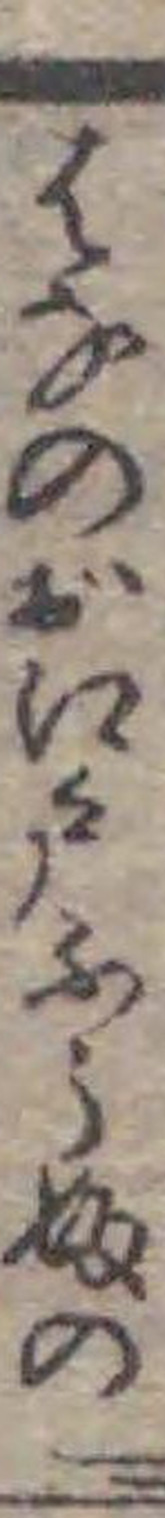はなのお江戸ふうふの
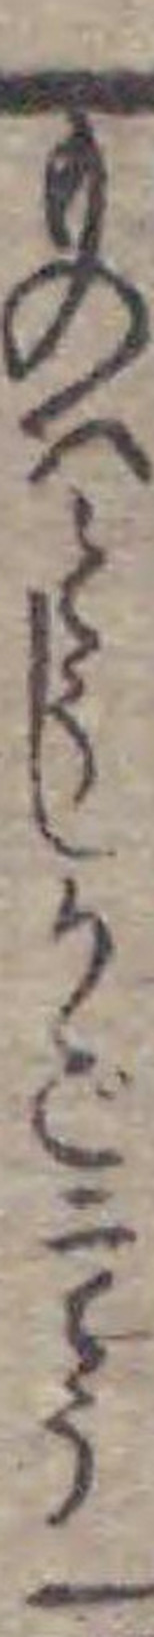ものはとうしかご二てう
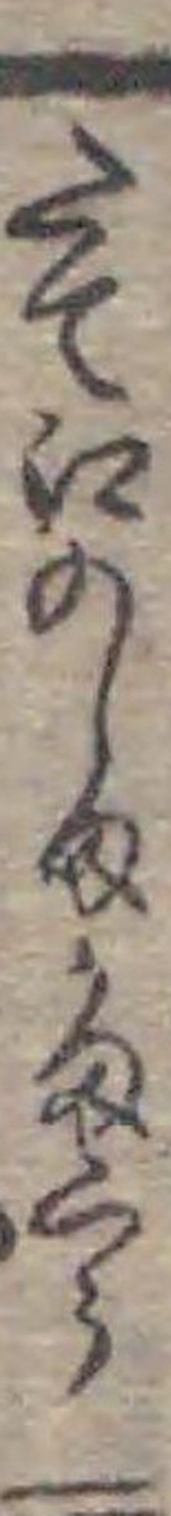たて江のしまかまくら
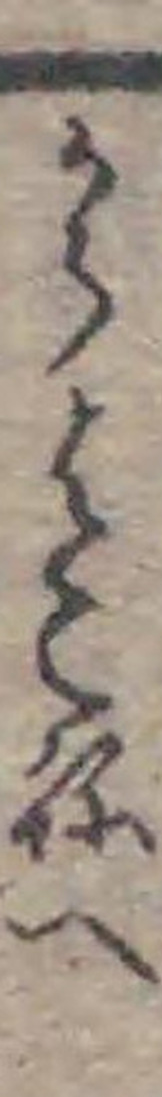うらはこねへ
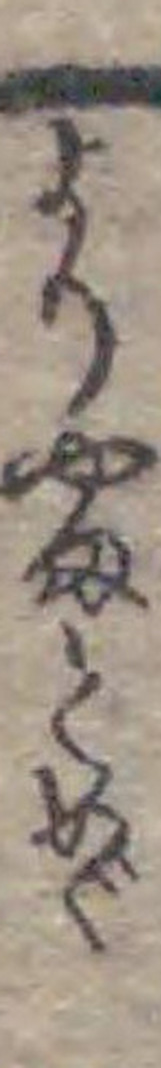よりやまとめぐ
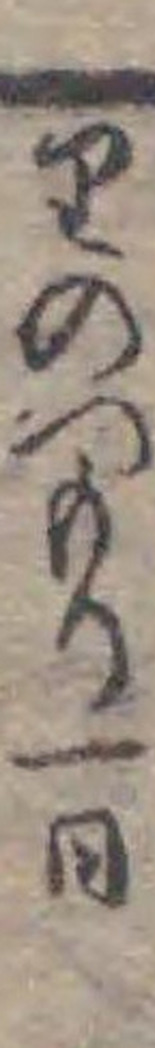りのつもり一日
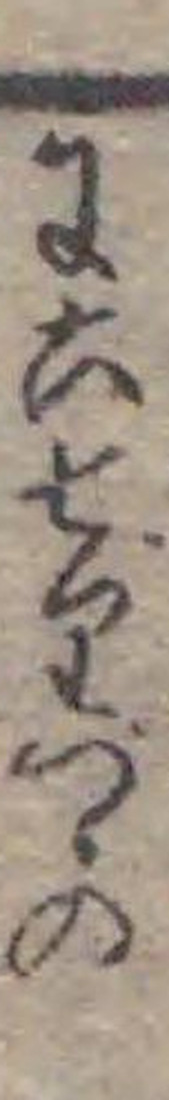に六七里づゝの
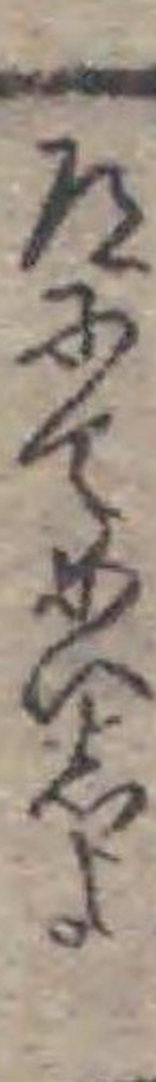道にてめいしよ
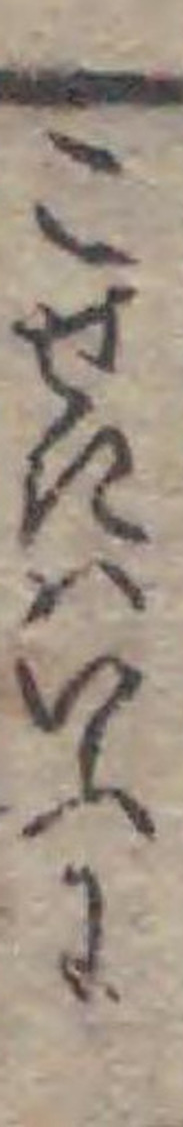こせきはいふに
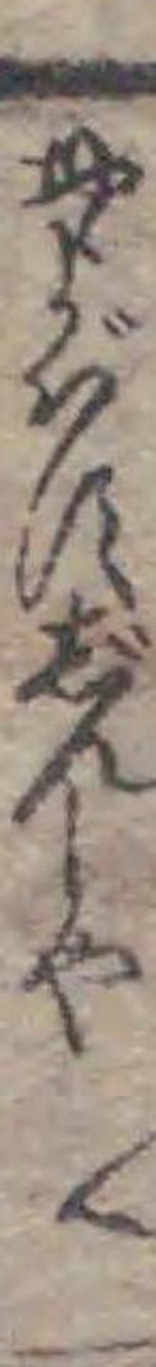およばすじんしや
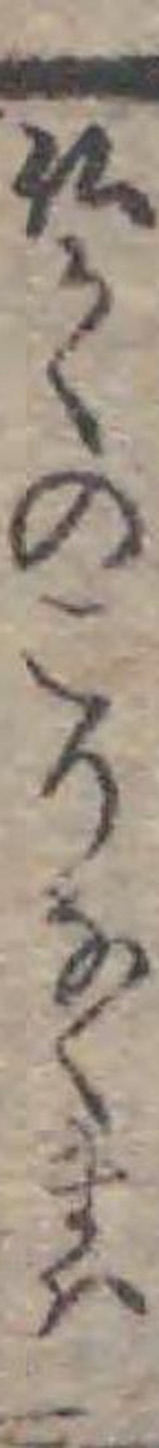仏かくのこりなくまは
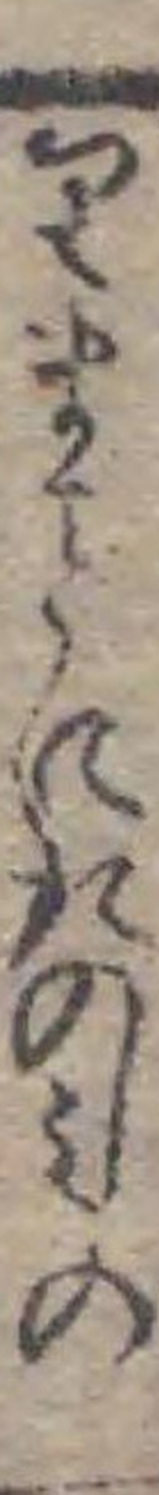りまことにたのしみの
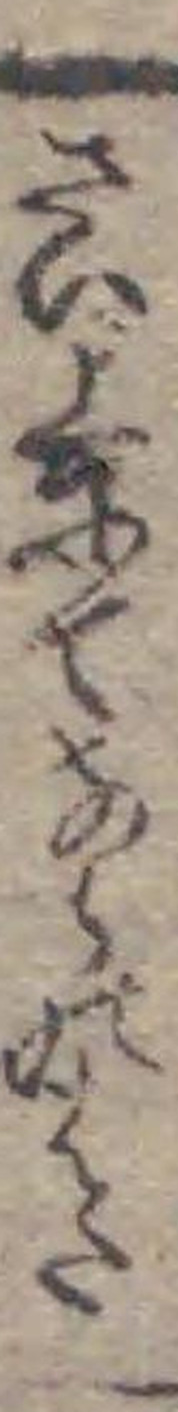さい上品にてならのはた
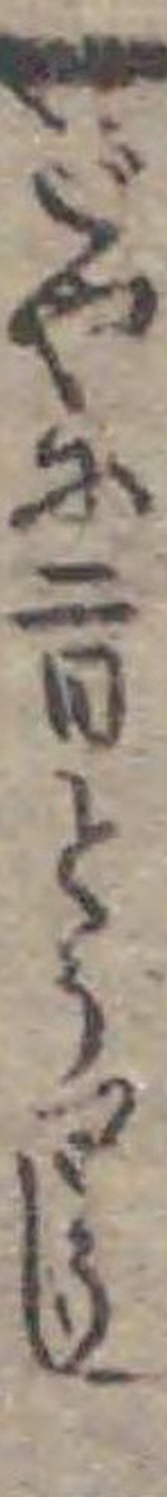ごやに二日とうりうし
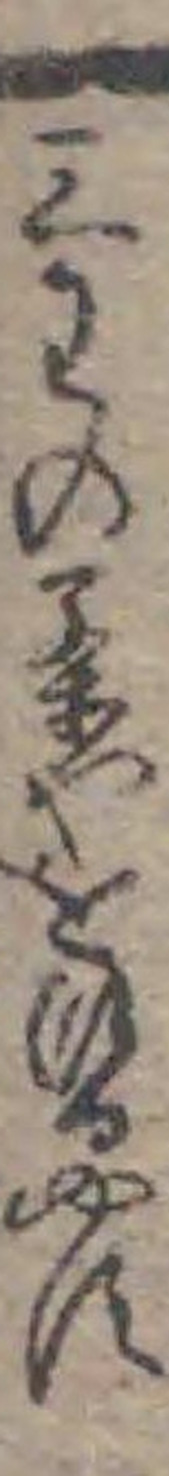三わの茶屋をひるやす
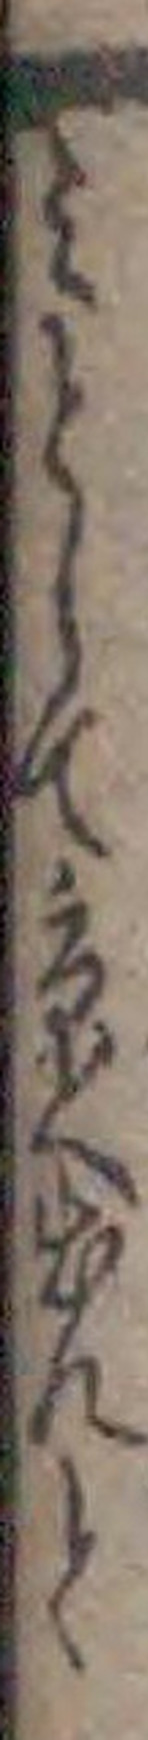みとして京へ出んと
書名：紺屋百物語 : 3巻
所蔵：国立国会図書館 National Diet Library, JAPAN
